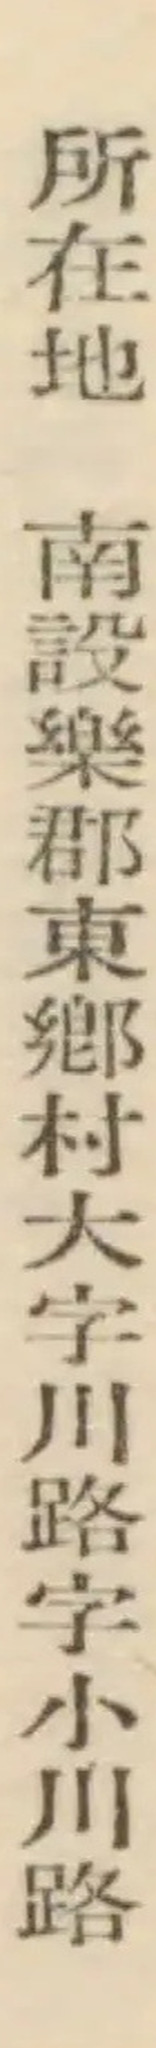所在地南設楽郡東郷村大字川路字小川路
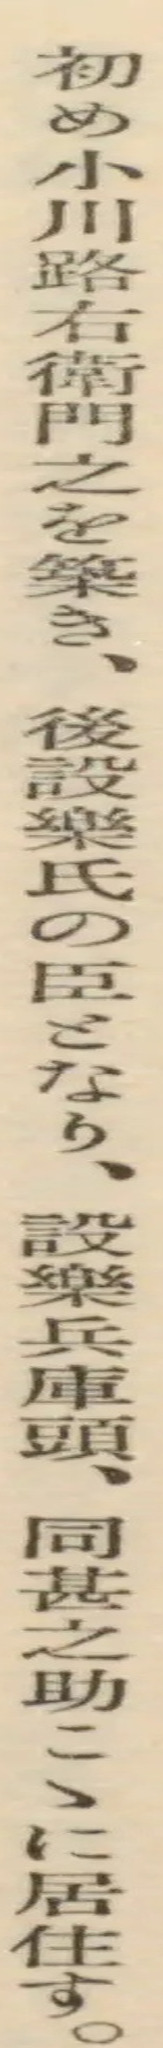初め小川路右衛門之を築き、後設楽氏の臣となり、設楽兵庫頭、同甚之助こゝに居住す。
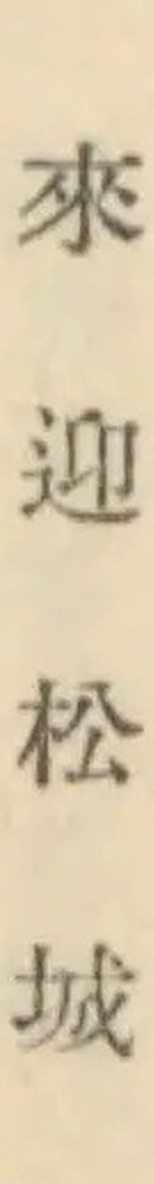来迎松城
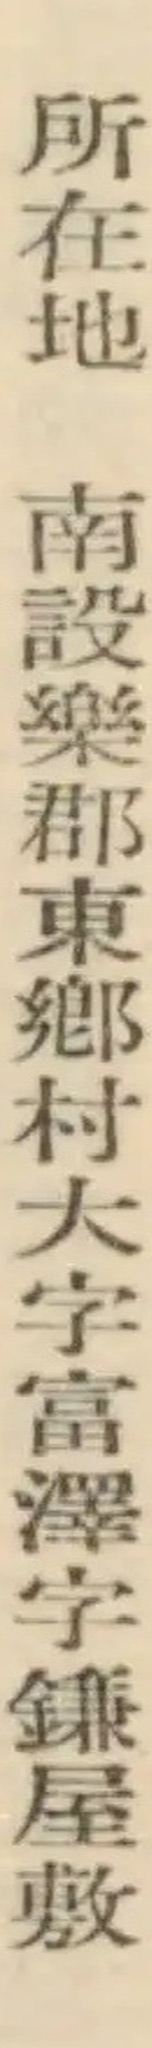所在地南設楽郡東郷村大字富沢字鎌屋敷
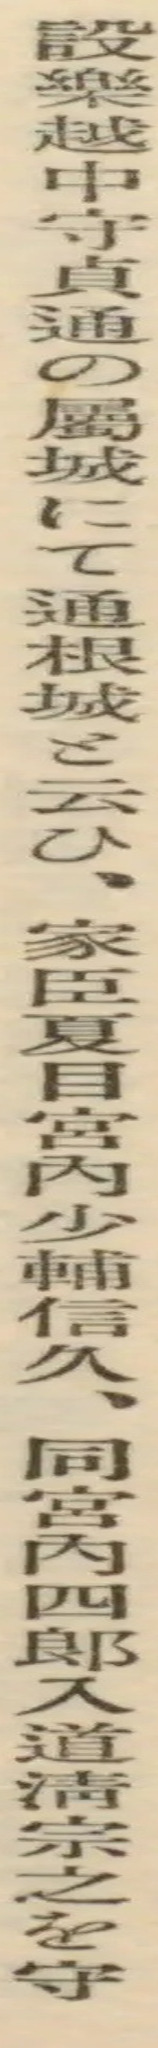設楽越中守貞通の属城にて通根城と云ひ、家臣夏目宮内少輔信久、同宮内四郎入道清宗之を守
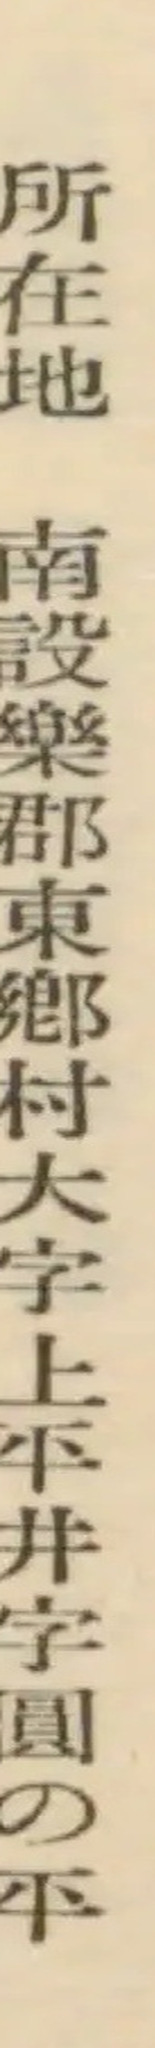所在地南設楽郡東郷村大字上平井字円の平
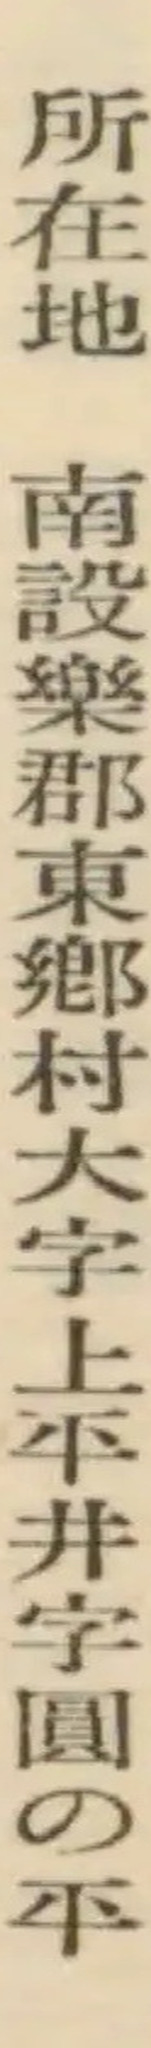所在地南設楽郡東郷村大字上平井字円の平
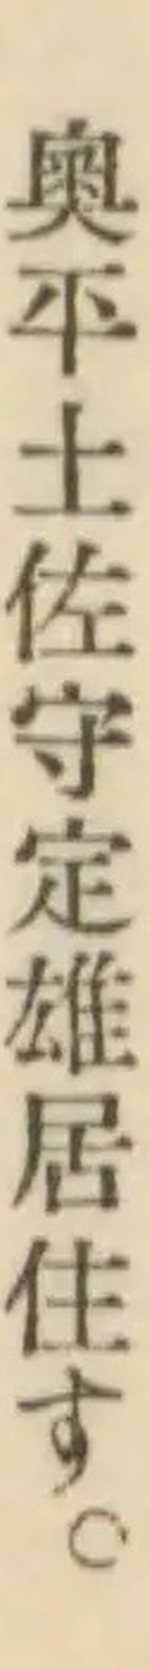奥平土佐守定雄居住す。
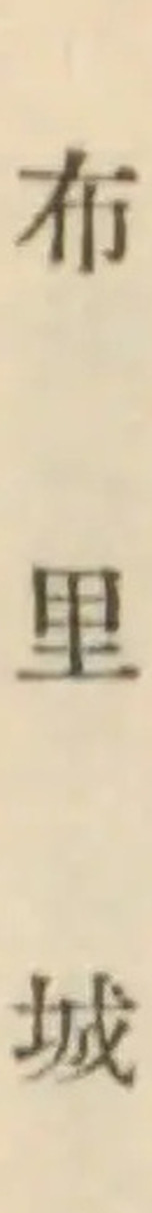布里城
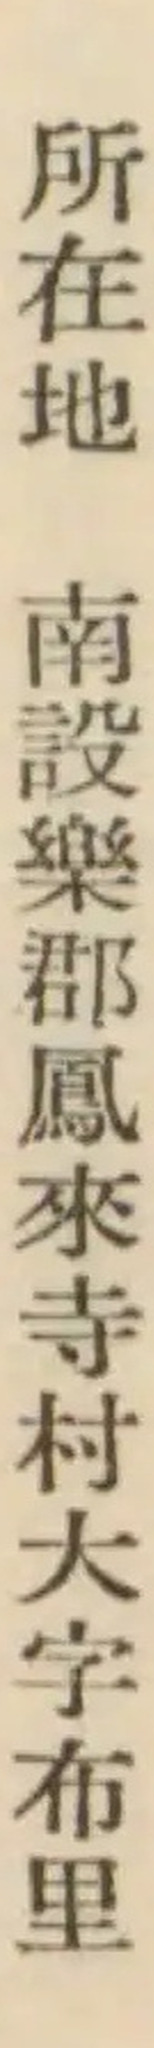所在地南設楽郡鳳来寺村大字布里
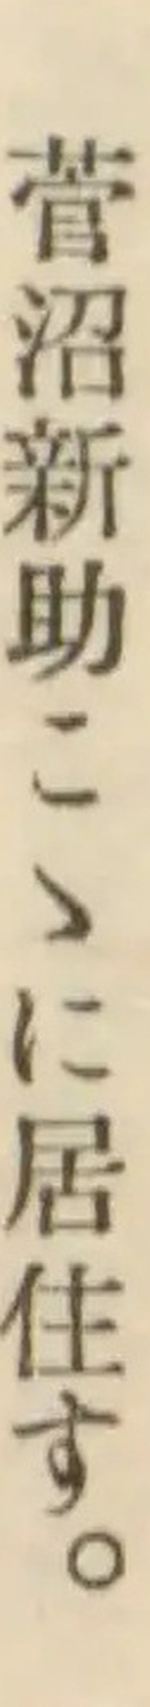菅沼新助こゝに居住す。
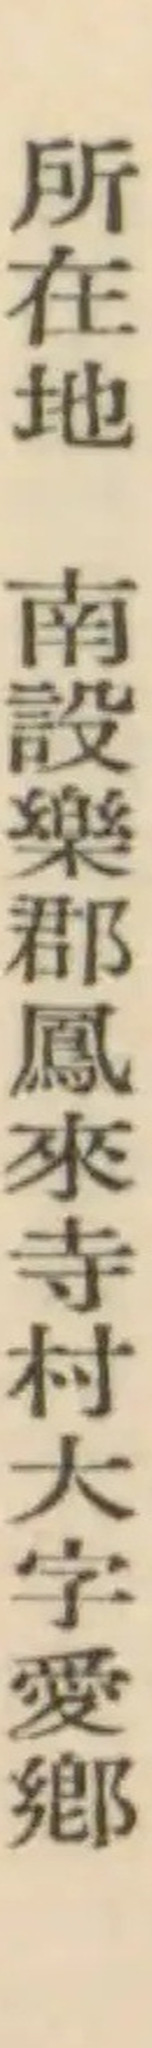所在地南設楽郡鳳来寺村大字愛郷
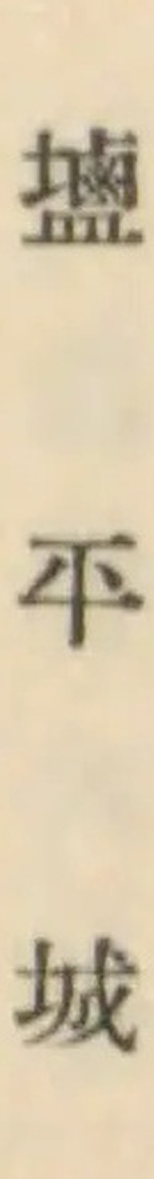塩平城
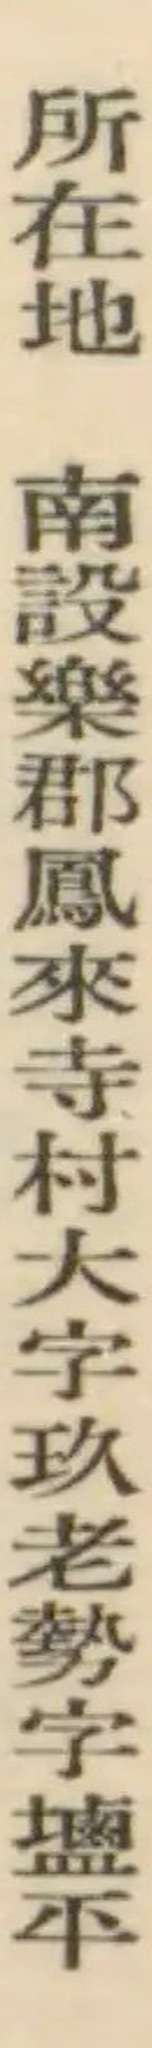所在地南設楽郡鳳来寺村大字玖老勢字塩平
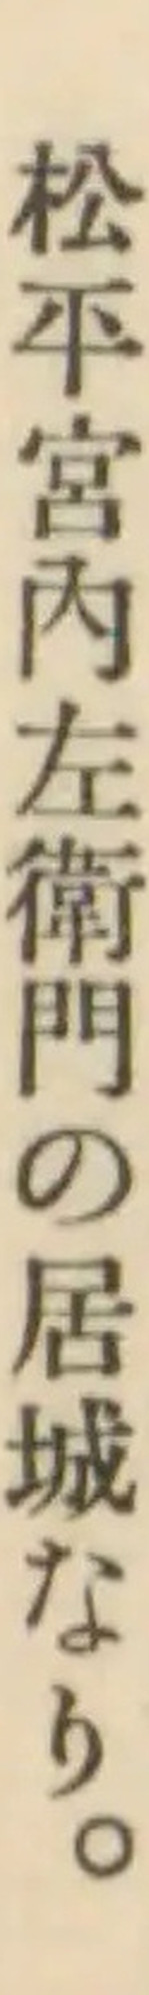松平宮内左衛門の居城なり。
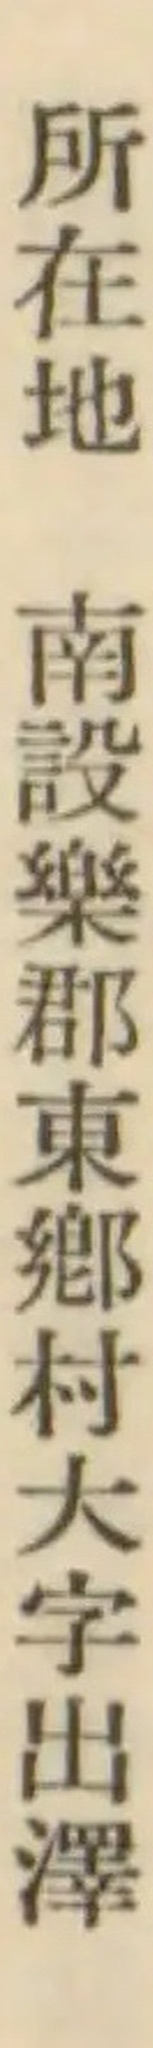所在地南設楽郡東郷村大字出沢
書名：東三河之古城
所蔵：国立国会図書館 National Diet Library, JAPAN
